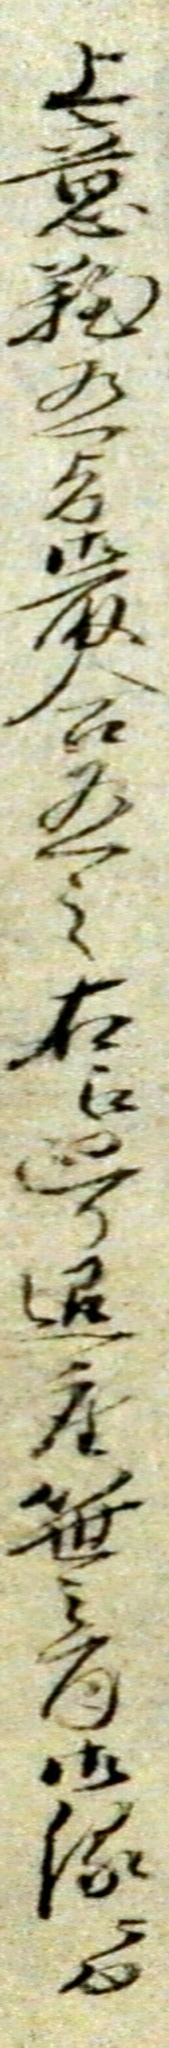上意難有旨御取合有之右江退座笹之間御縁二而
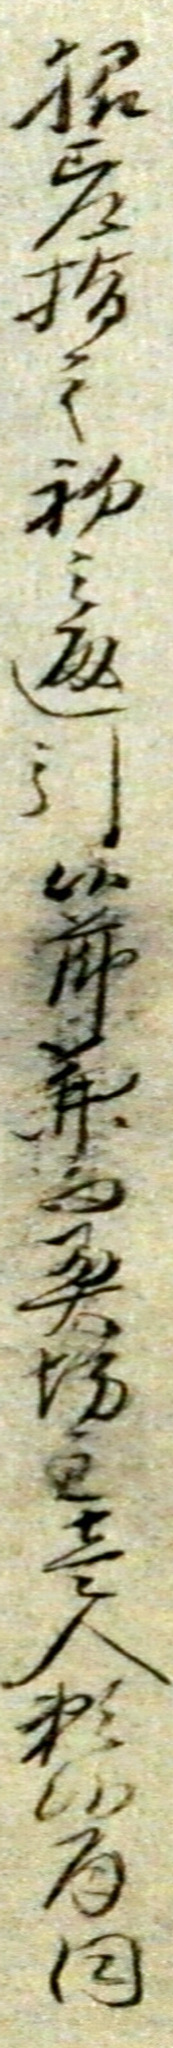脇差指之初之通引候節兼而奥坊主壱人頼候間同
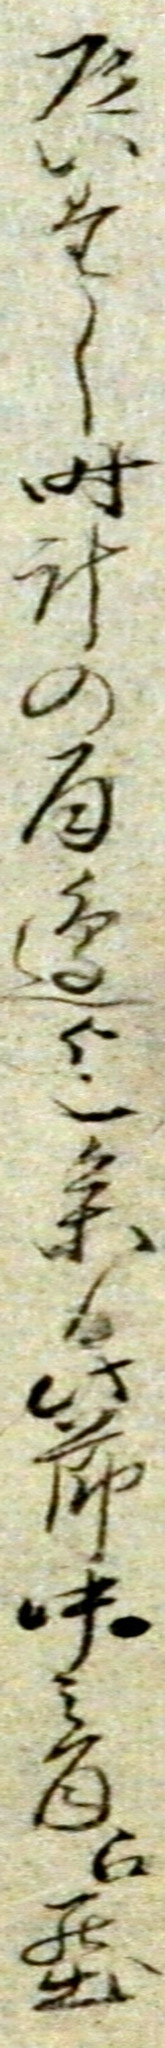道い堂し時計之間邊迄参り此節中之間江罷出
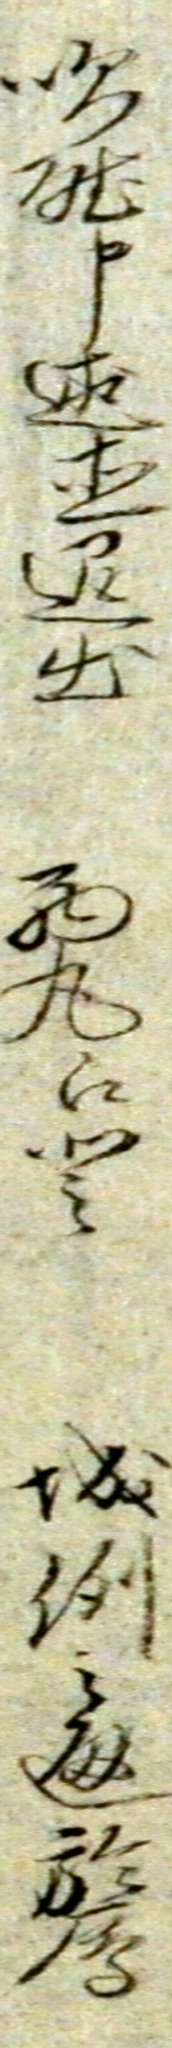吹聴申述直退出西丸江登城例之通於雁
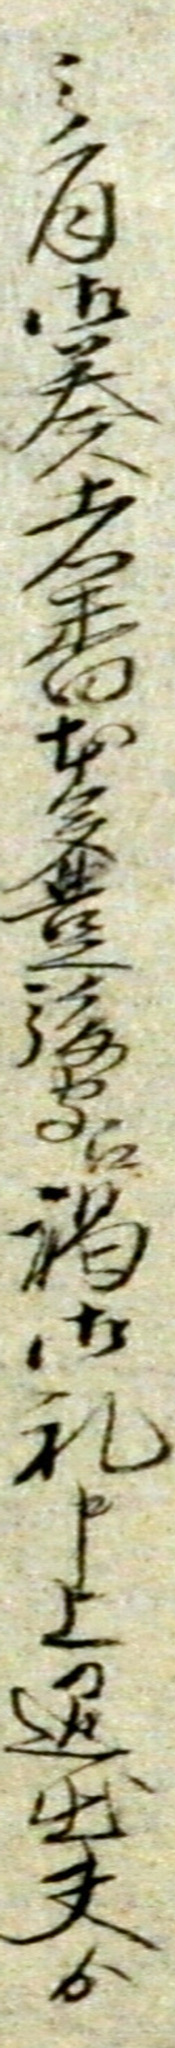之間御奏者番本多豊後守江謁御礼申上退出夫ゟ
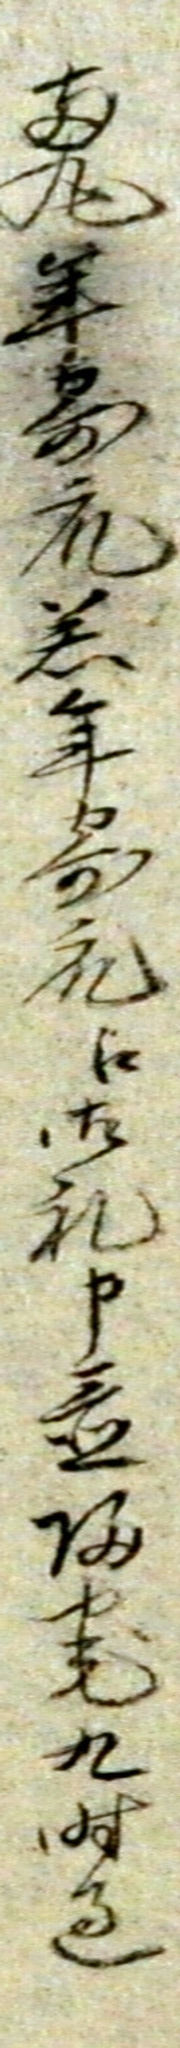西丸年寄衆若年衆江御礼申置帰宅九時過
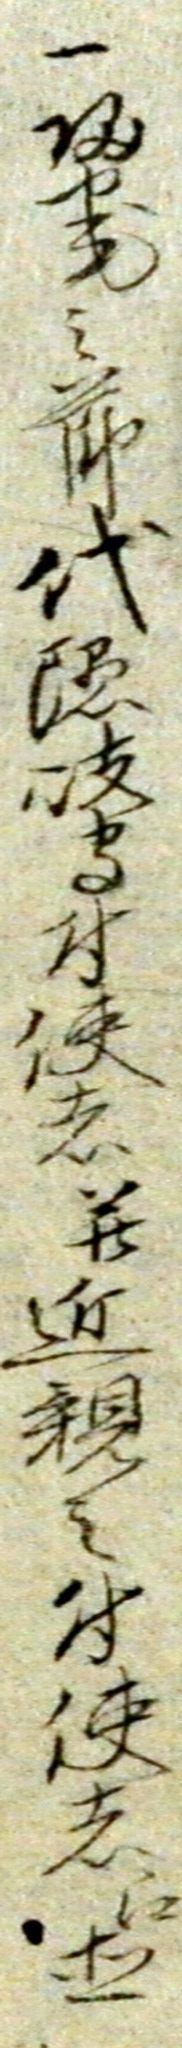一帰宅之節代隠岐守付使者幷近親之付使者江直
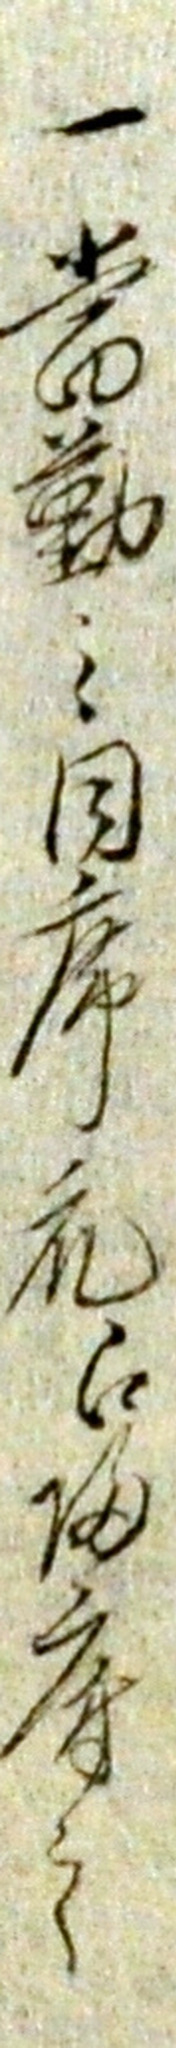一當勤之同席衆江帰府之
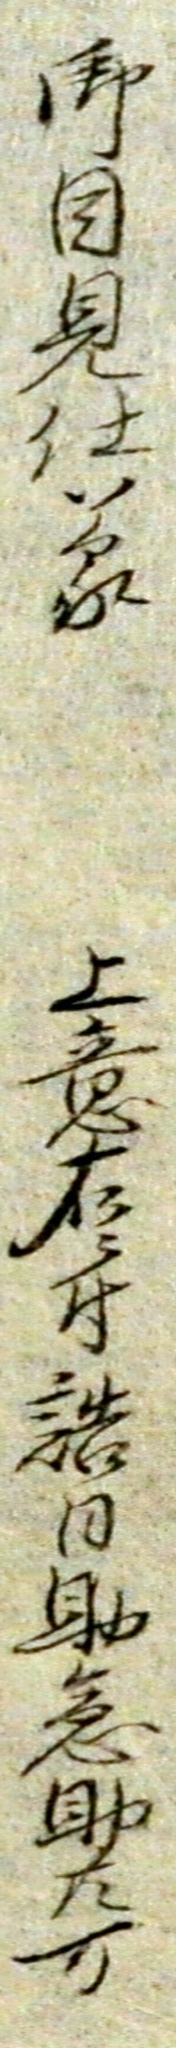御目見仕蒙上意右二付詰日助急助太刀
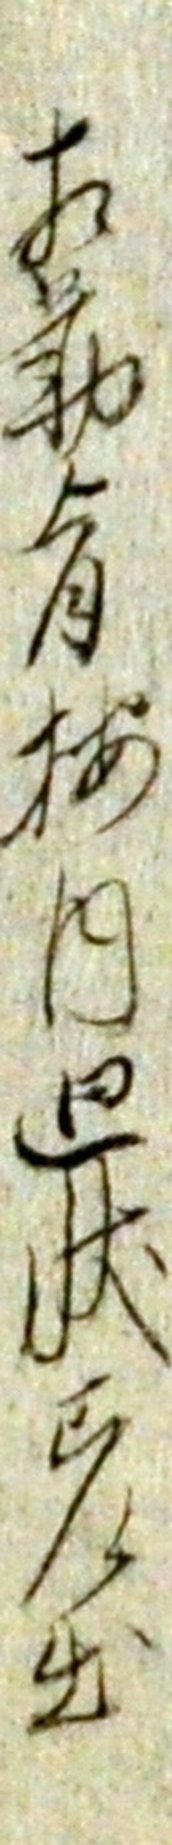相勤旨按内廻状差出
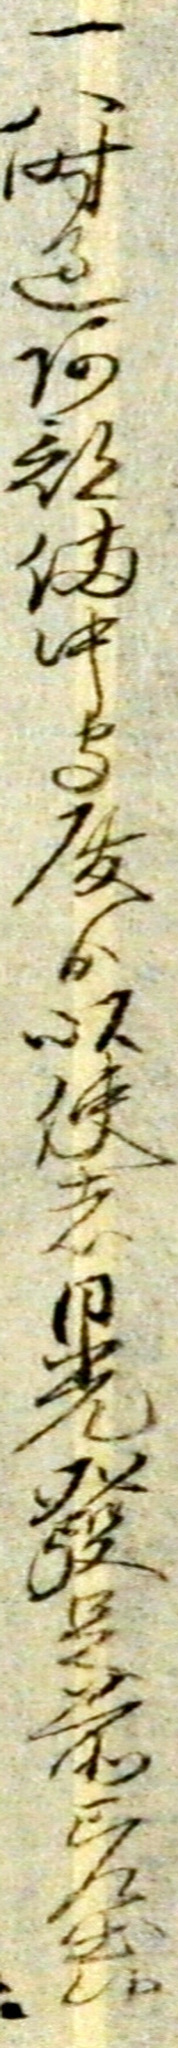一八時過阿部備中守殿ゟ以使者日光発足前差出候
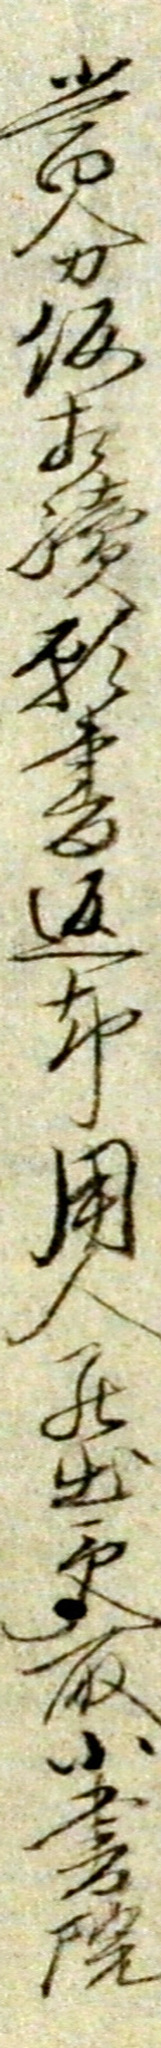当分仮相続願書返却用人罷出受取小院江
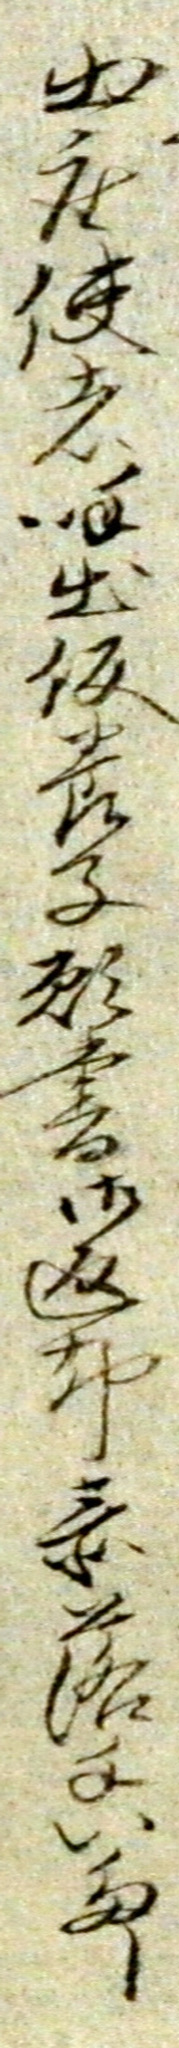出座使者呼出仮養子願書御返却忝落手い多し
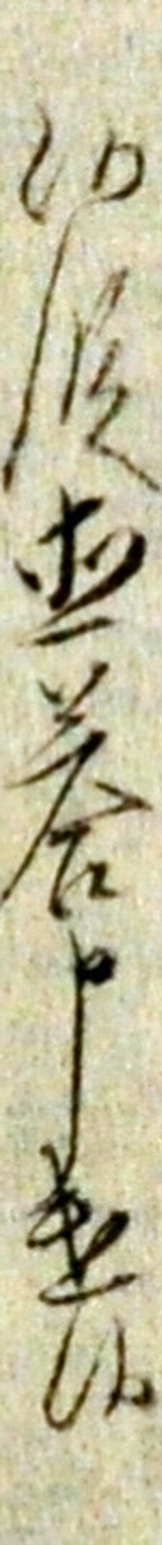候段直答申遣候
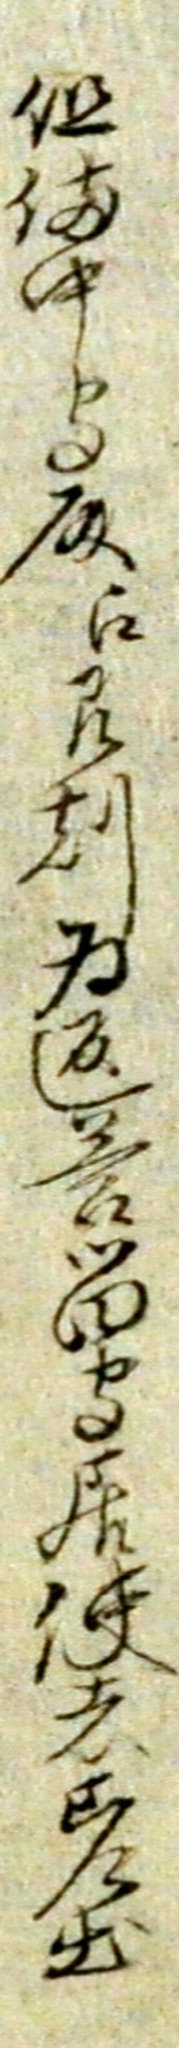但備中守殿江即刻為返答留守居使者差出
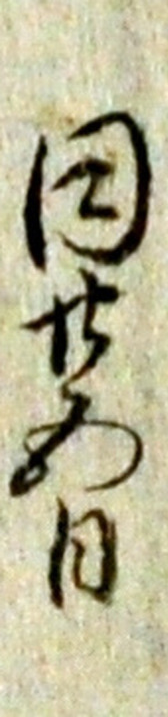同廿五日
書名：日光御名代相勤候節ノ留
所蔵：伊那市立高遠町図書館・合同会社AMANE
